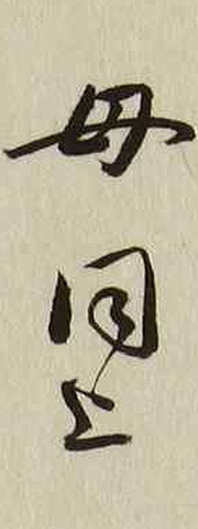母同上
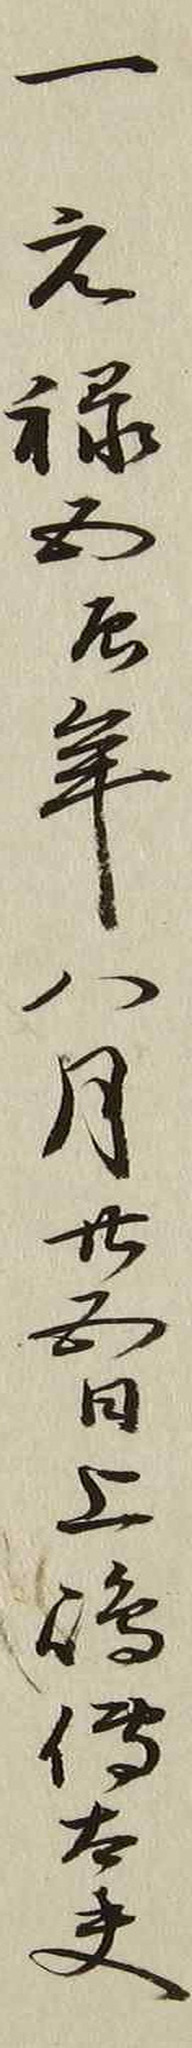一元禄五辰年八月廿五日上嶋傳太夫
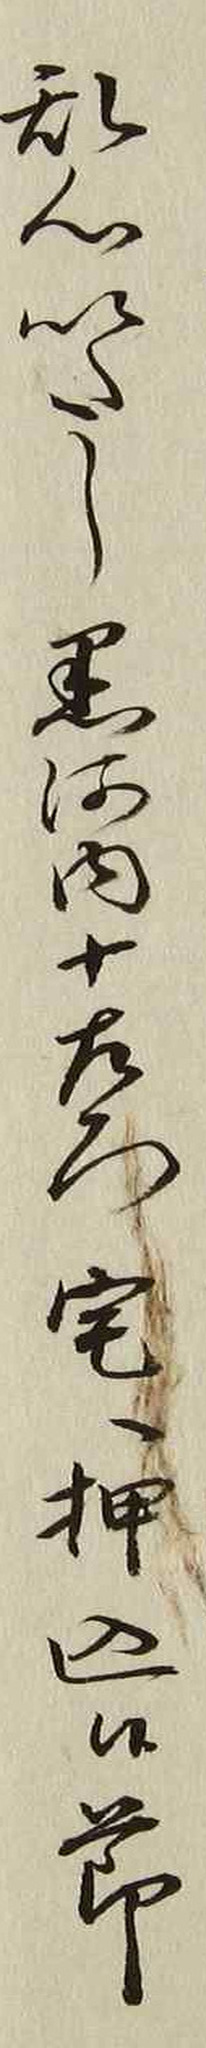乱心いたし黒河内十左衛門宅へ押込候節
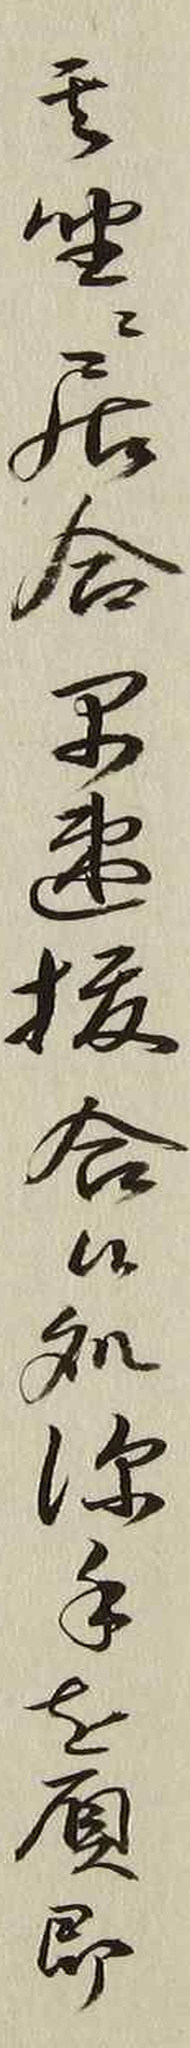其坐ニ居合早速抜合候処深手を負即
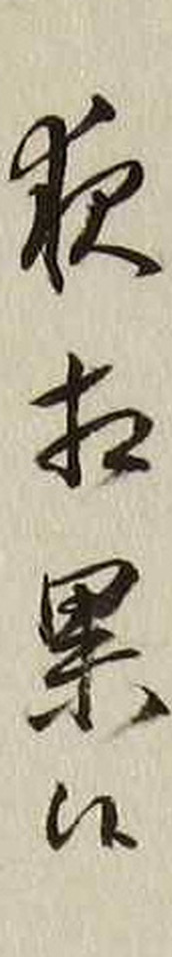夜相果候
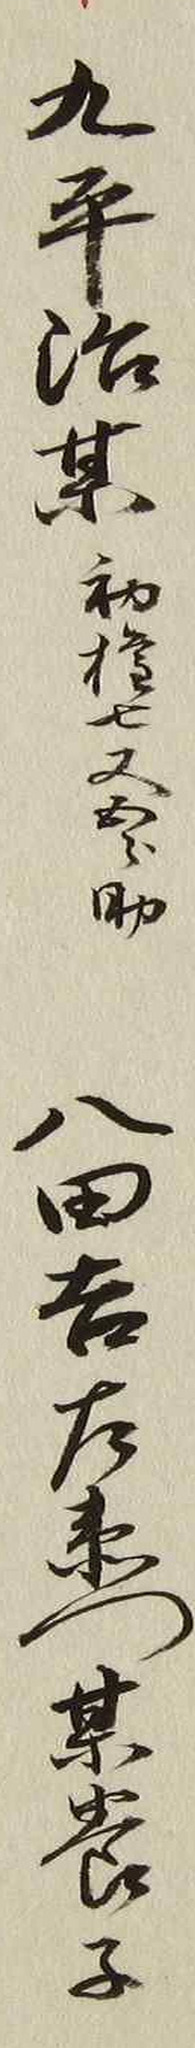九平治某初権七又五郎助八田吉左衛門某養子
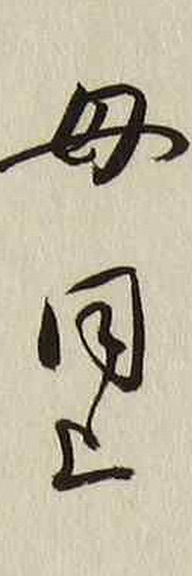母同上
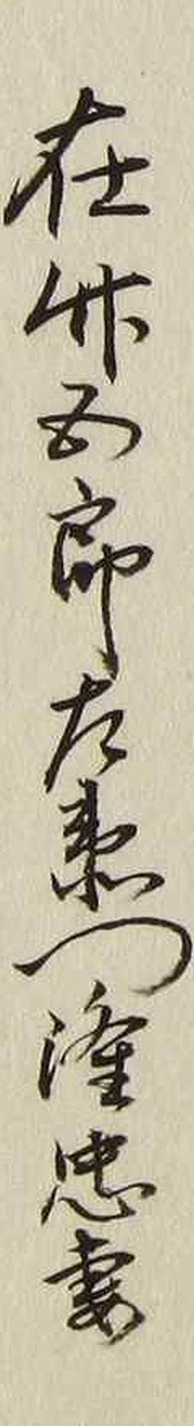女在竹五郎左衛門隆忠妻
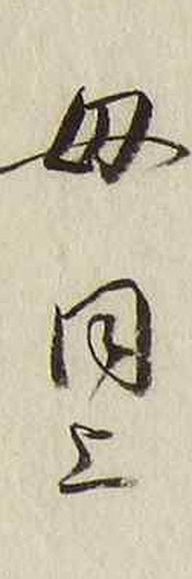母同上

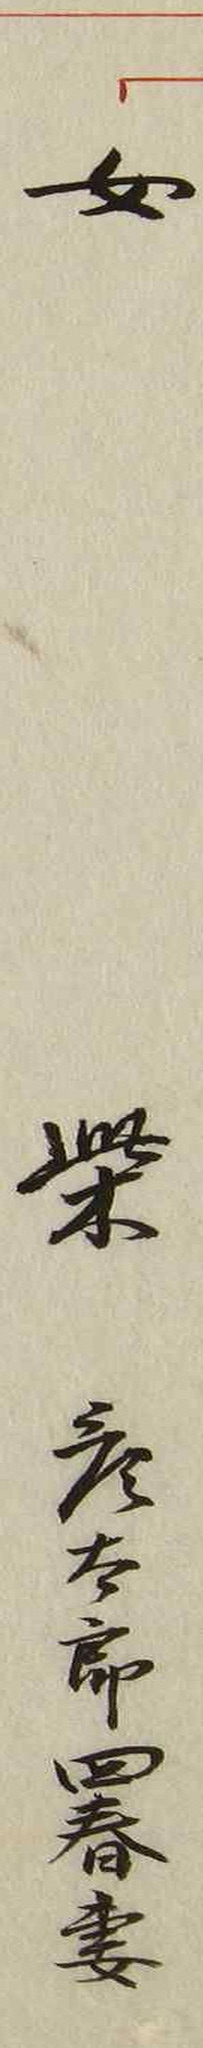女柴彦太郎四春妻
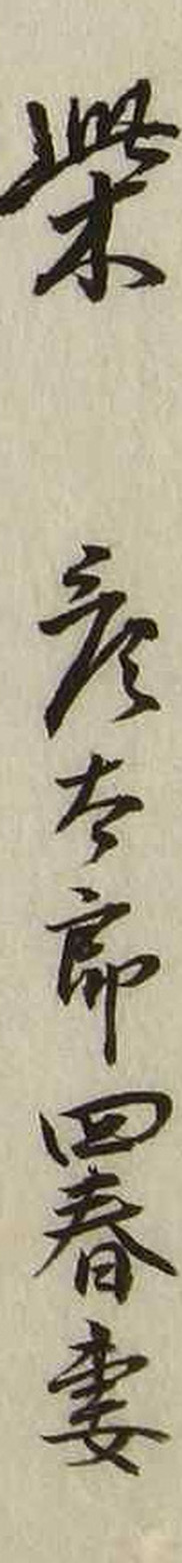女柴彦太郎四春妻
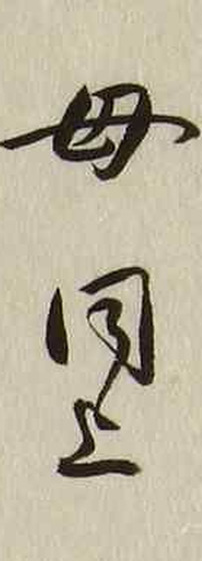母同上
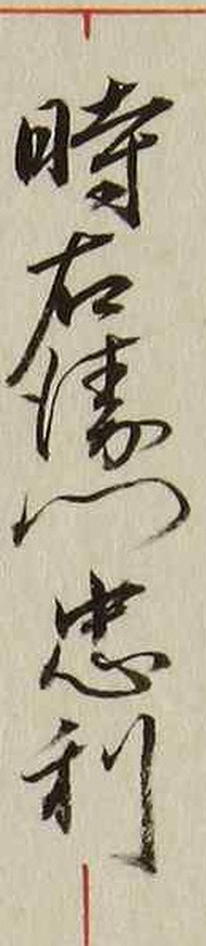時右衛門忠利
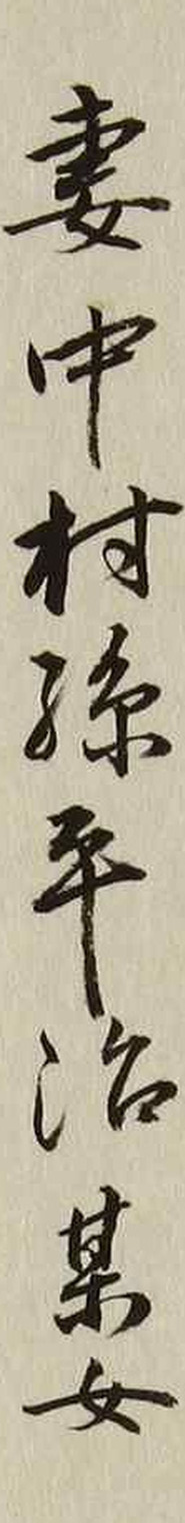妻中村孫平治某女
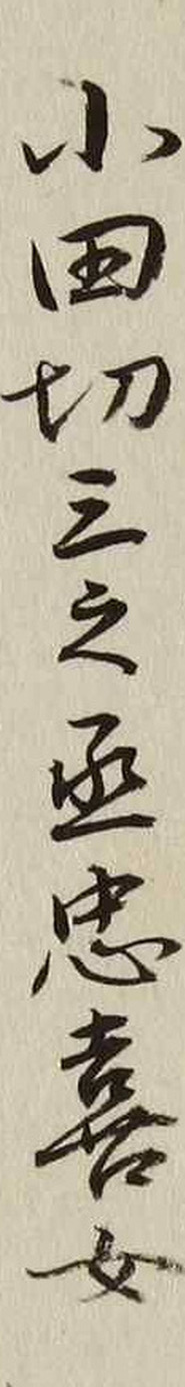小田切三之丞忠喜女
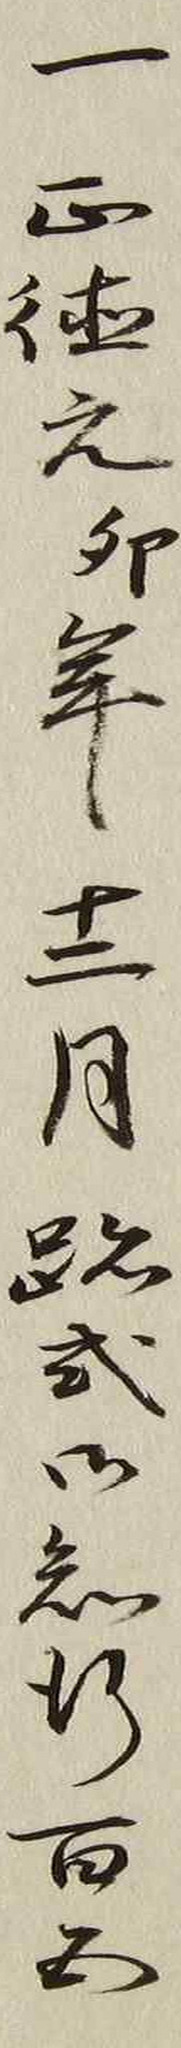一正徳元卯年十二月跡式御知行百五
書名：諸士系譜　巻之160　な之部2
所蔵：会津若松市立会津図書館
